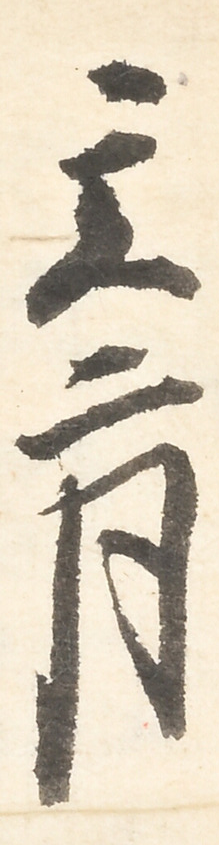亥二月
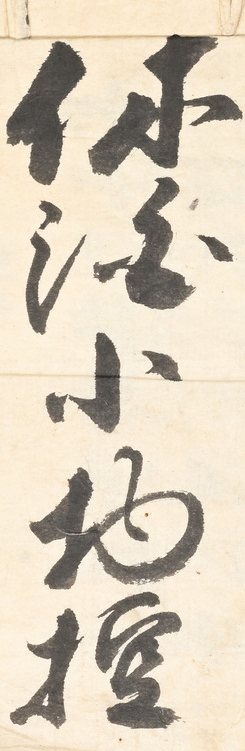休泊小物控

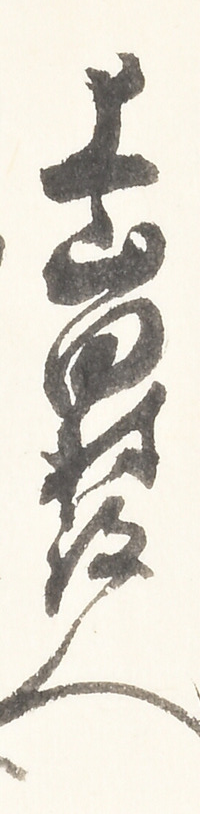上山田村役人
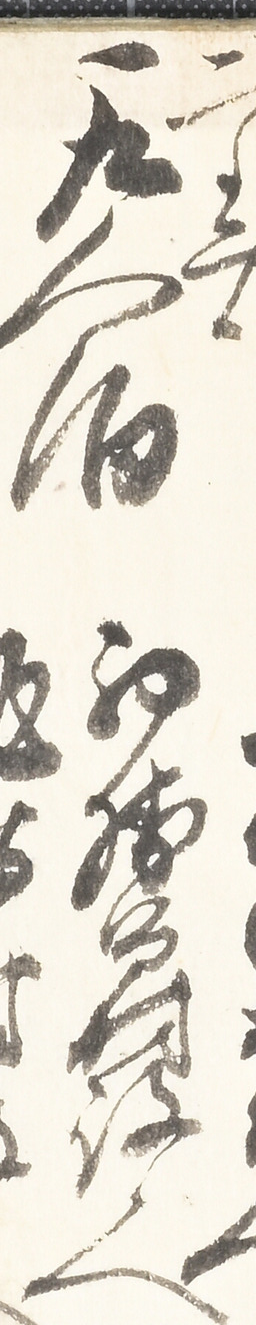一九人泊非持村役人
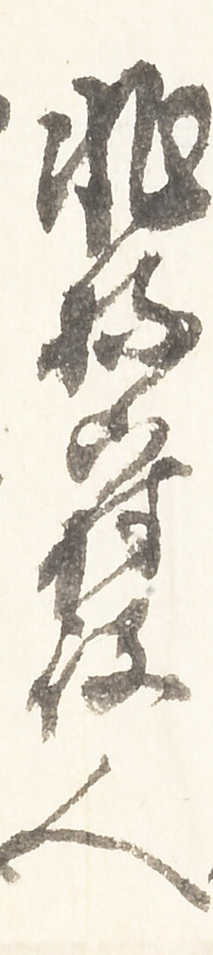非持山村役人
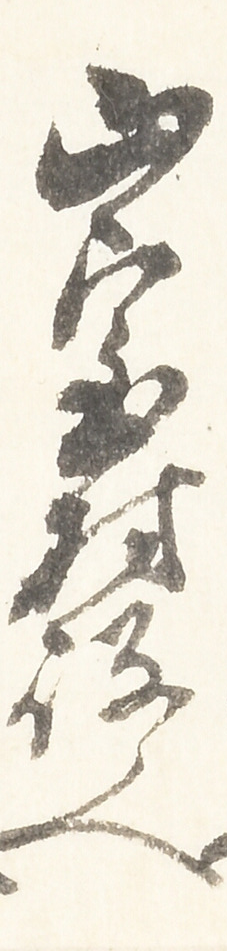山室村役人
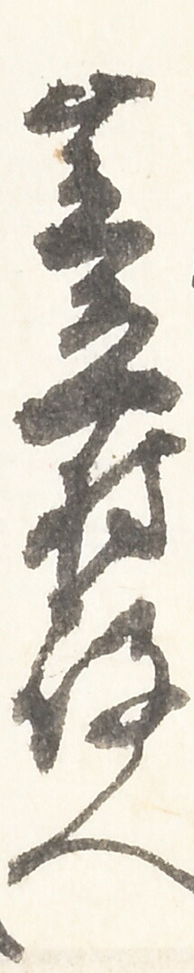芝平村役人
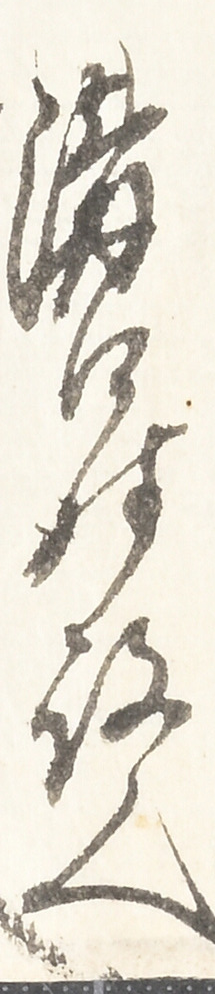溝口村役人

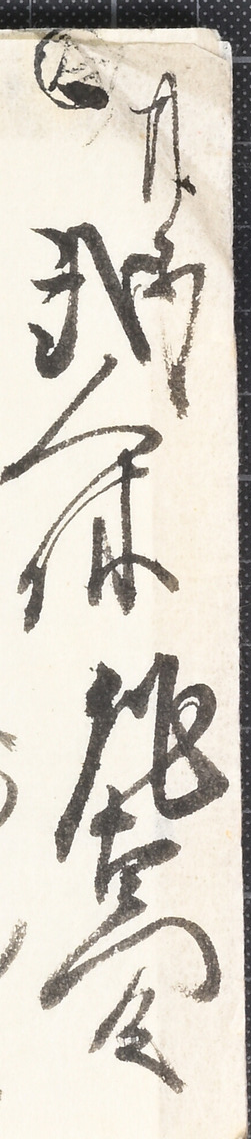一弐人休作右衛門殿
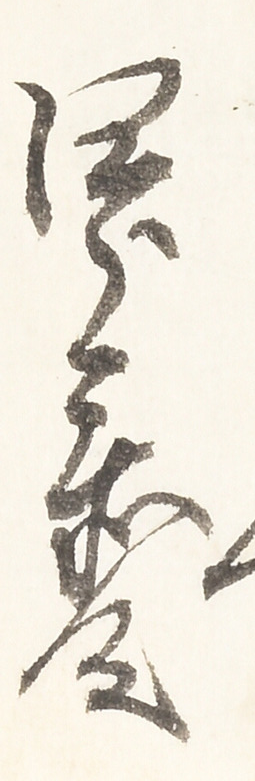四郎兵衛殿
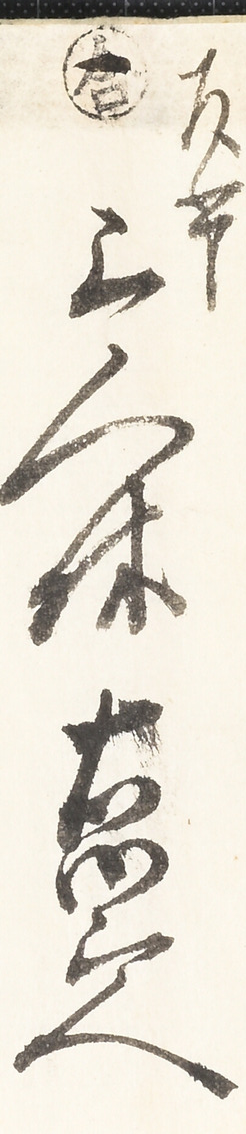一三人休右御三人
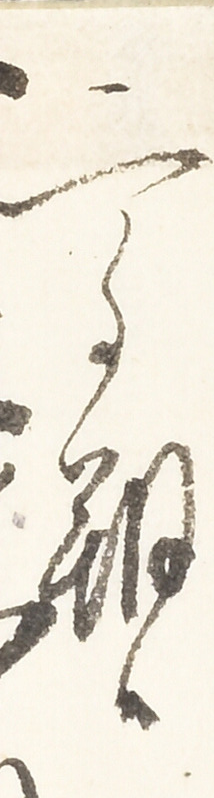二月朔日
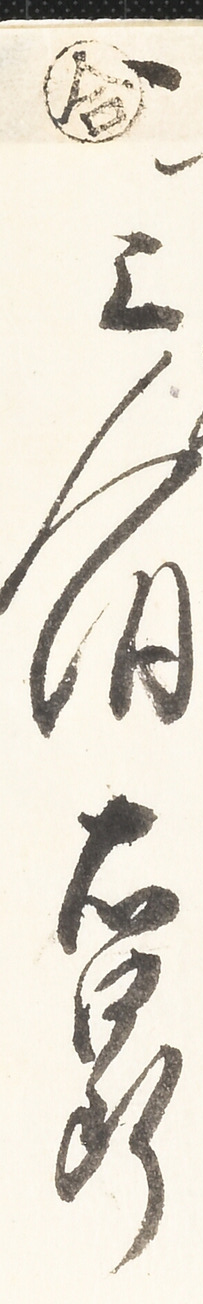一三人泊右同断
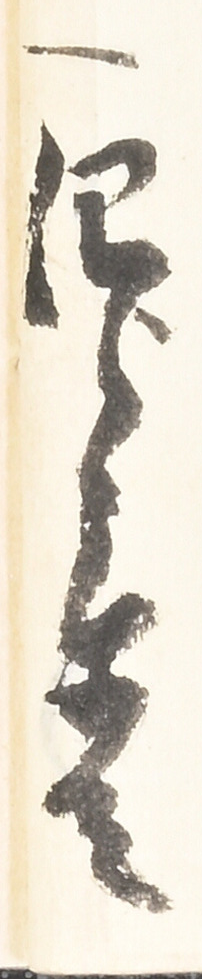四郎兵衛殿
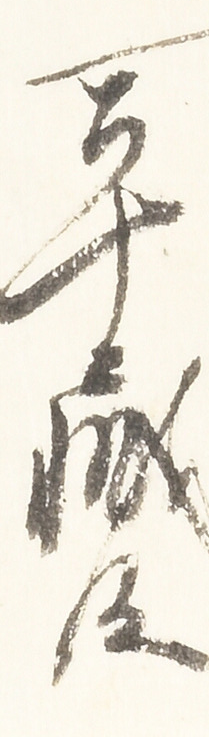平蔵殿
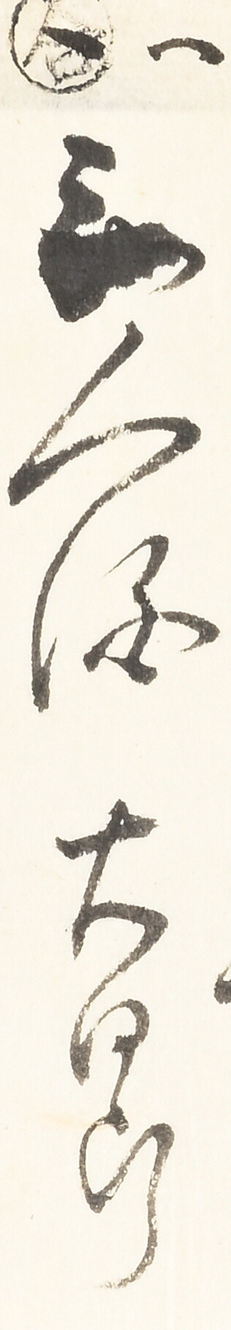一三人泊右同断
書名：亥二月休泊小物控
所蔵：伊那市立高遠町図書館・合同会社AMANE
